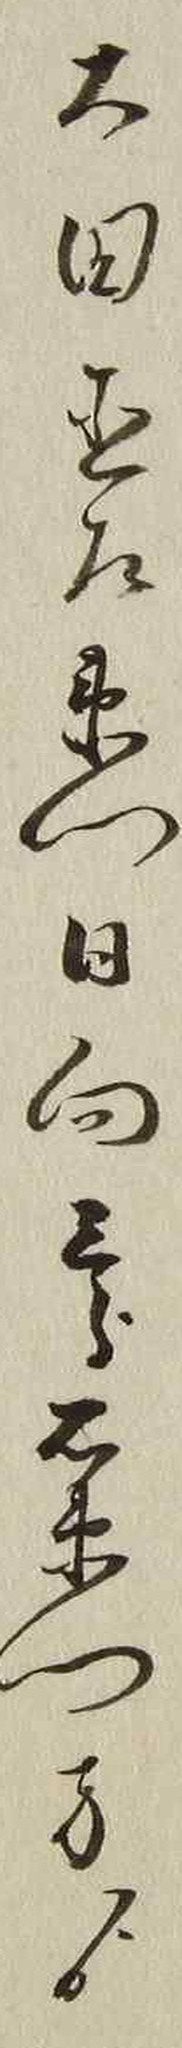大田直左衛門日向三郎右衛門方ゟ
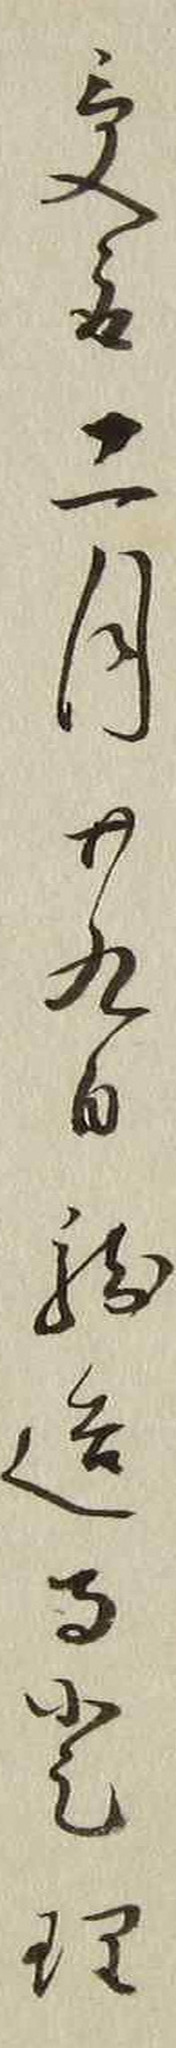受取十一月廿九日龍造寺登理
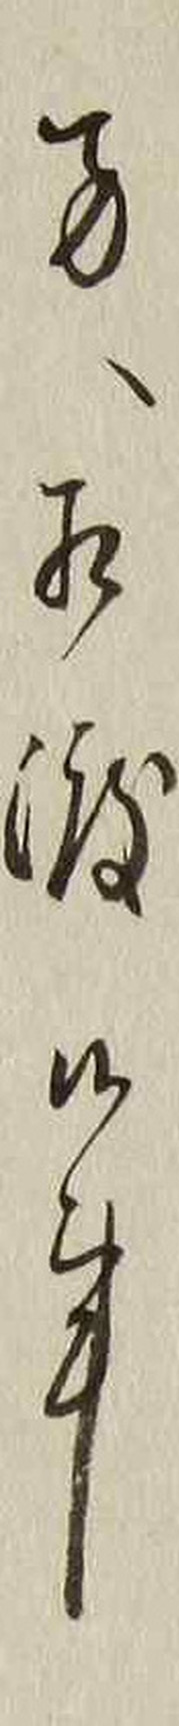方へ相渡候事
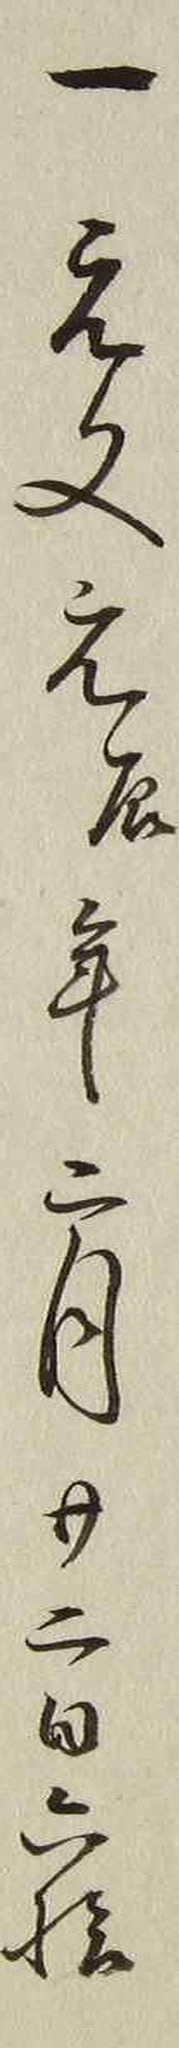一元文元辰年二月廿二日六拾
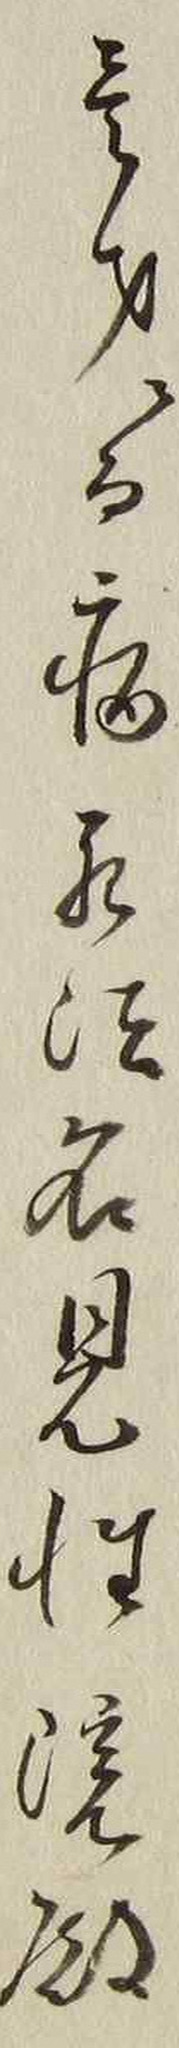壱才に而病死法名見性院殿
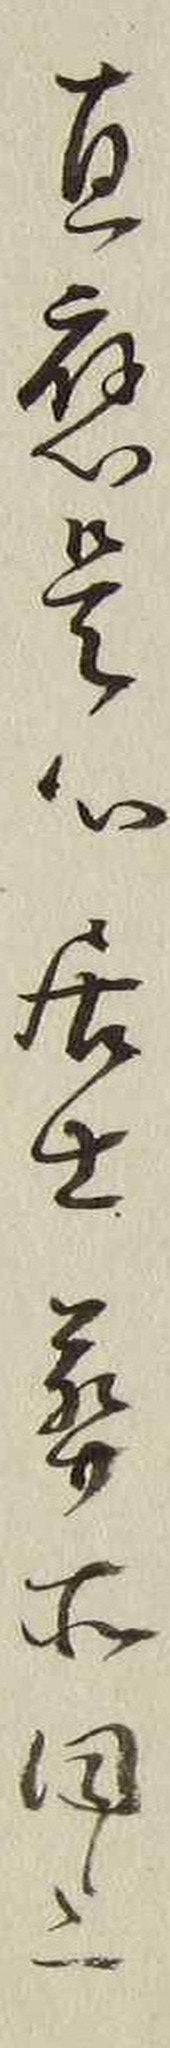直応是心居士葬所同上
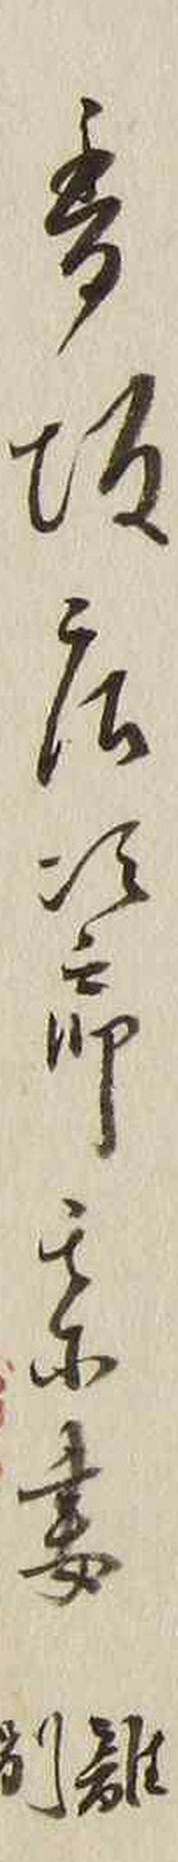女香坂庄次郎某妻別離
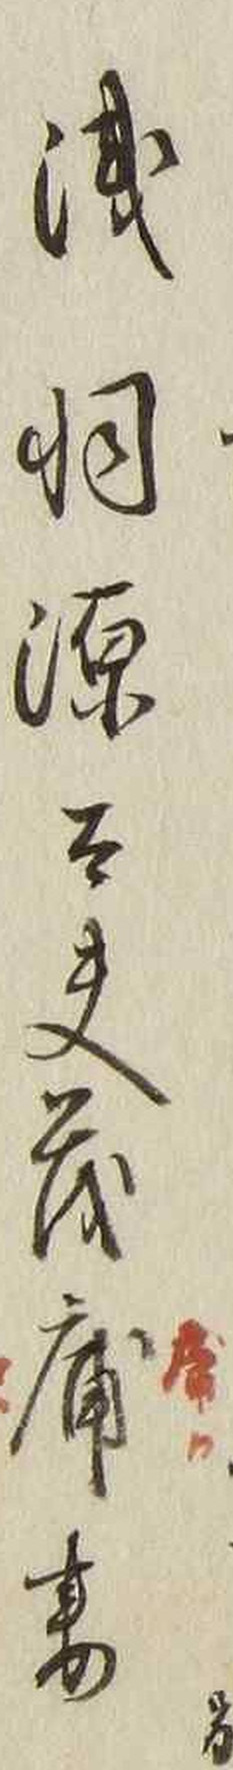浅羽源太夫茂庸妻

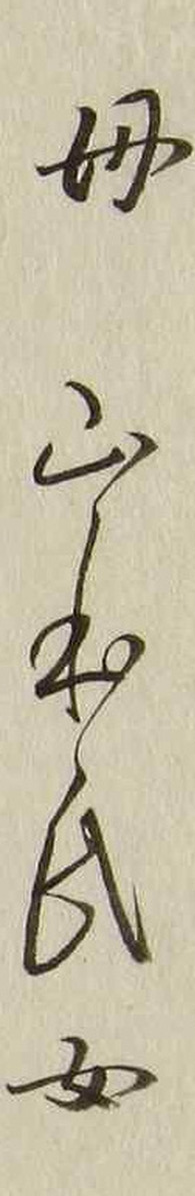母山本氏女
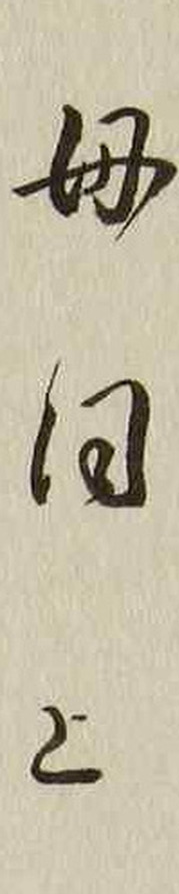母同上
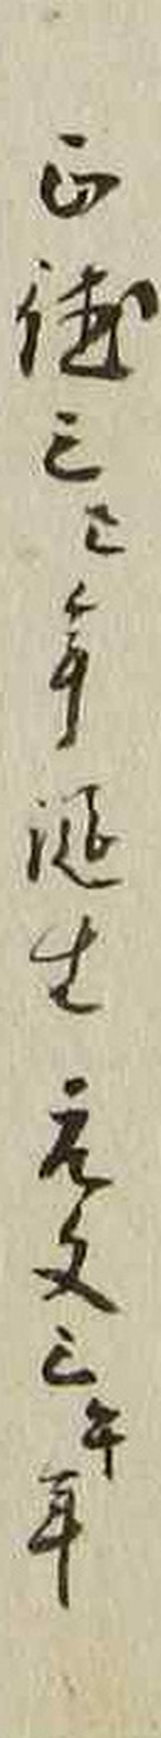正徳三巳年誕生元文三丑年
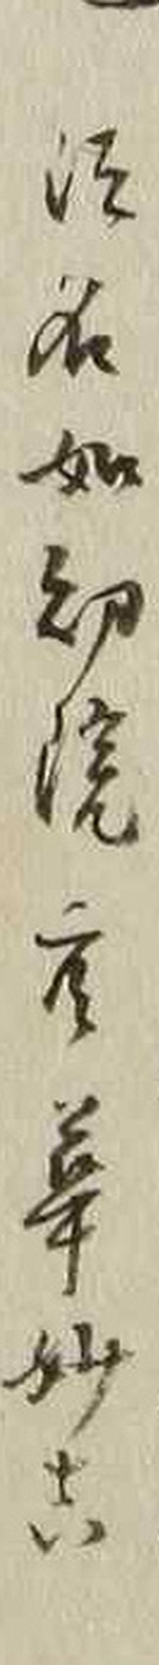法名如幼院空華妙古
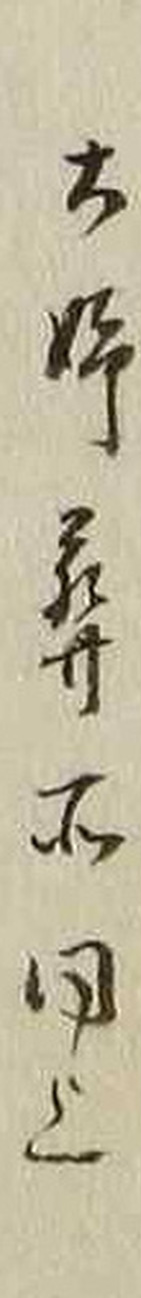大姉葬所同上
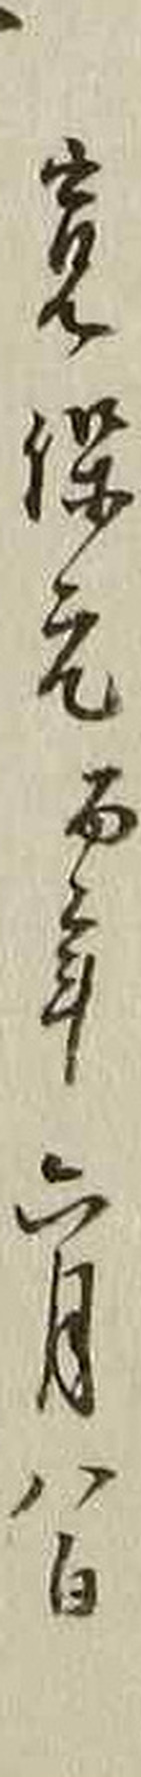寛保元酉年六月八日
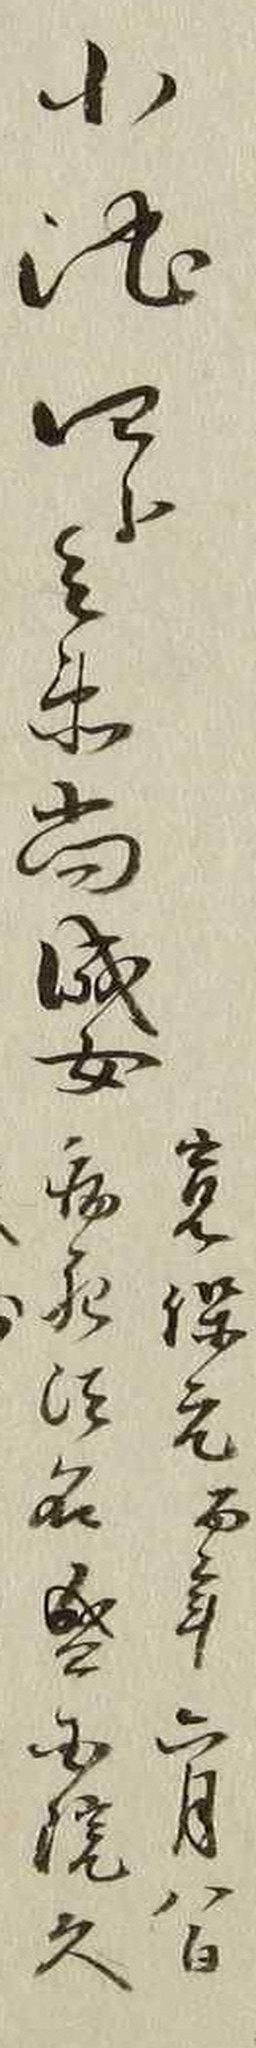小池四郎兵衛尚成女病死法名盛花院久
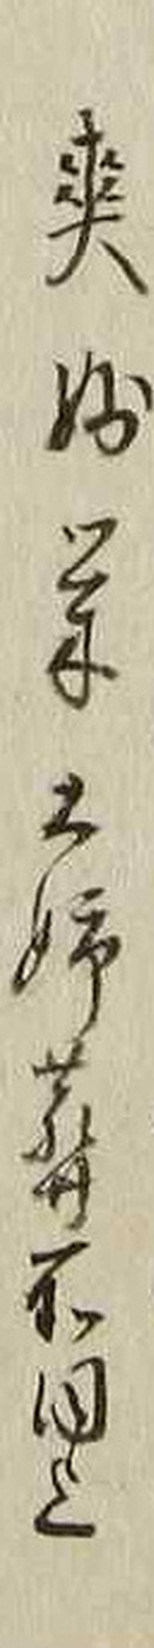爽妙栄大姉葬所同上
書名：諸士系譜　巻之159　な之部1
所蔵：会津若松市立会津図書館
